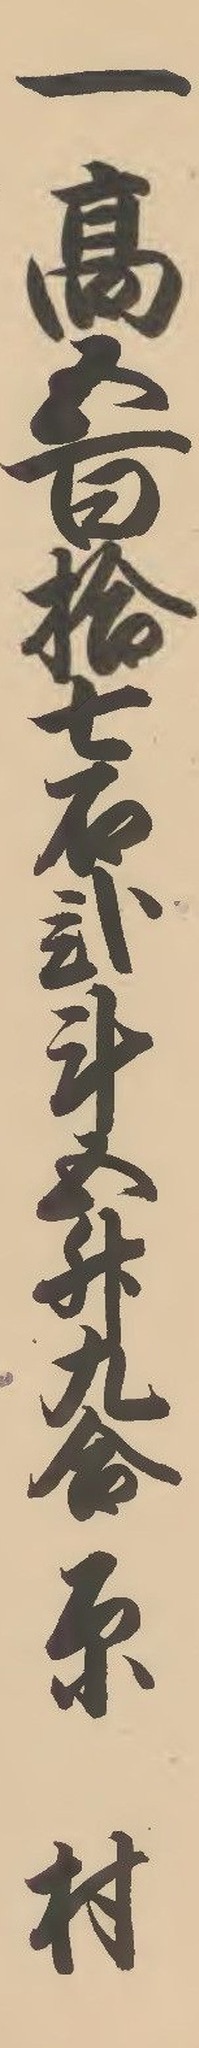一髙五百拾七石弐斗五升九合原村
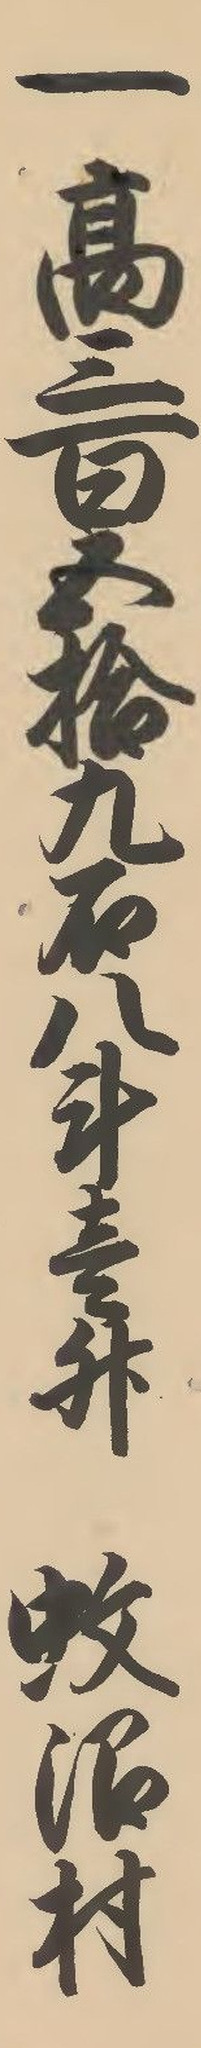一髙三百五拾九石八斗壱升蚊沼村
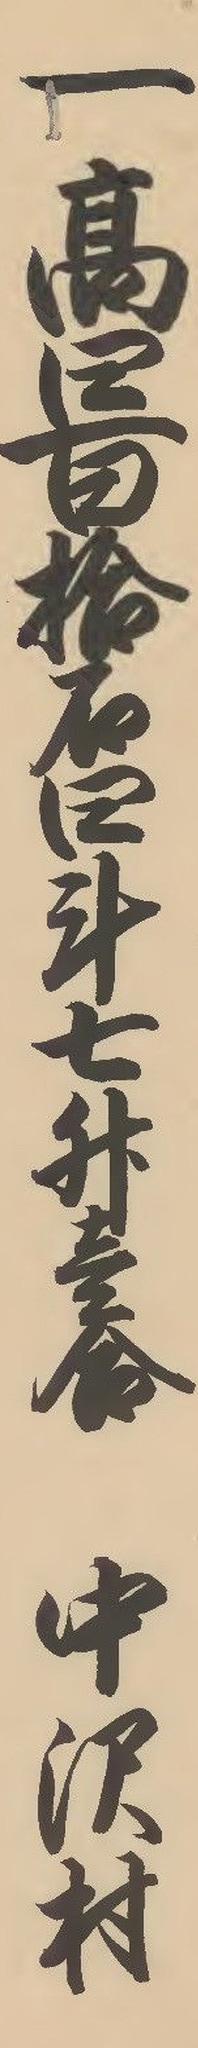一髙四百拾石四斗七升壱合中沢村
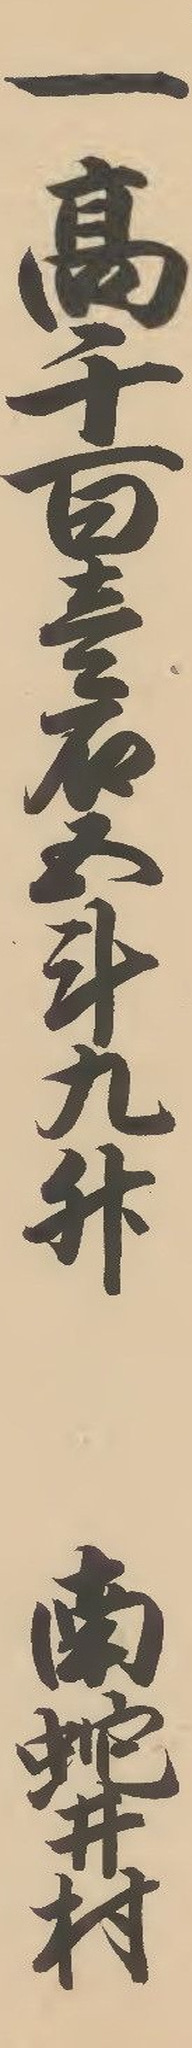一髙千百壱石五斗九升南蛇井村
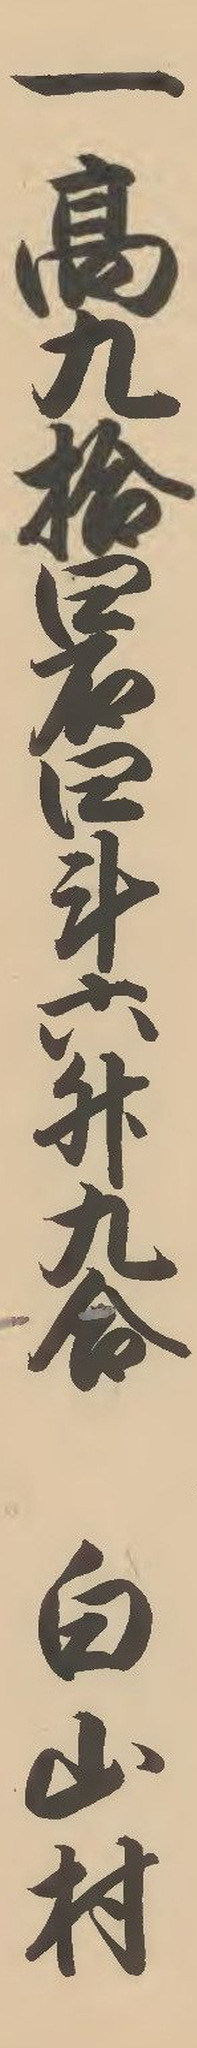一髙九拾四石四斗六升九合白山村

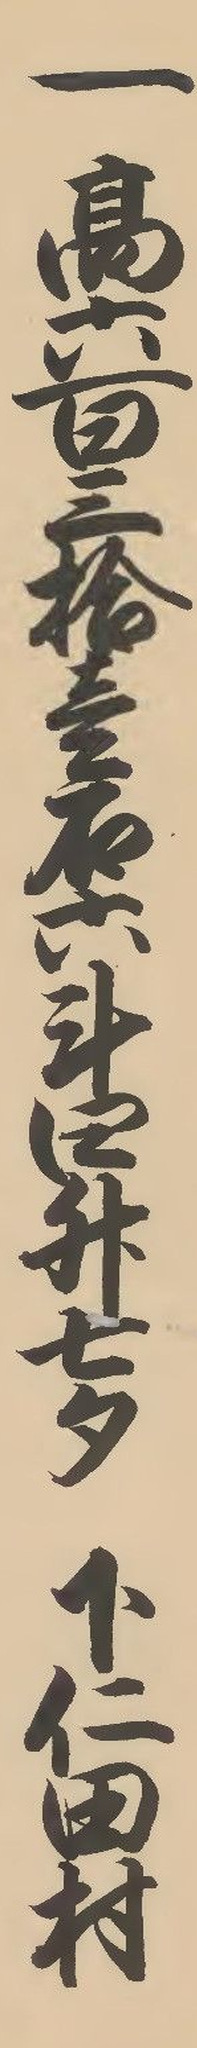一髙六百三拾壱石六斗四升七夕下仁田村
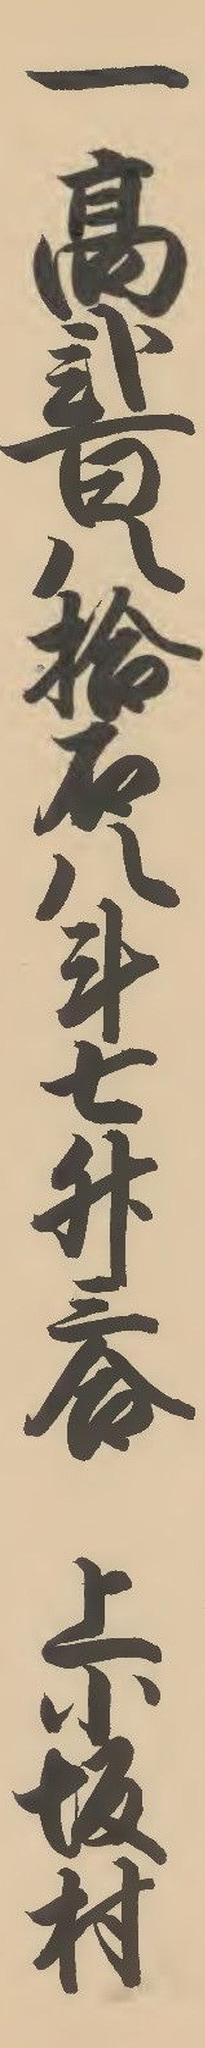一髙弐百八拾石八斗七升三合上小坂村
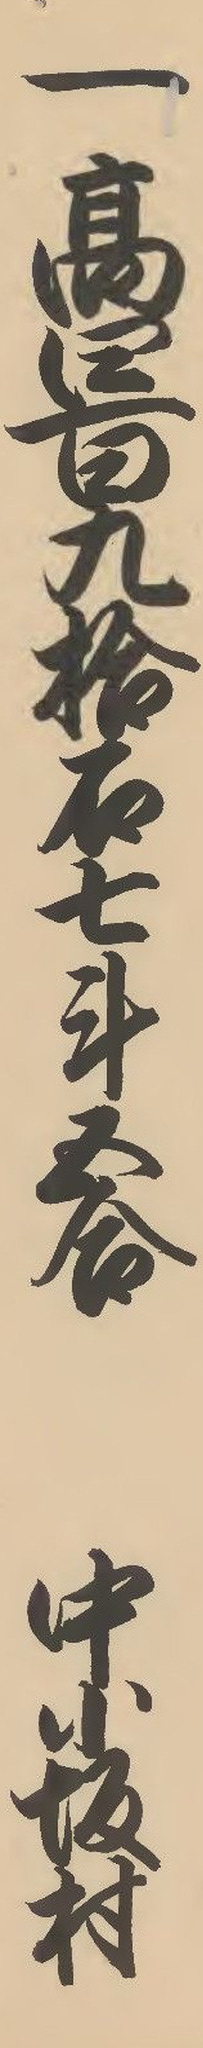一髙四百九拾石七斗五合中小坂村
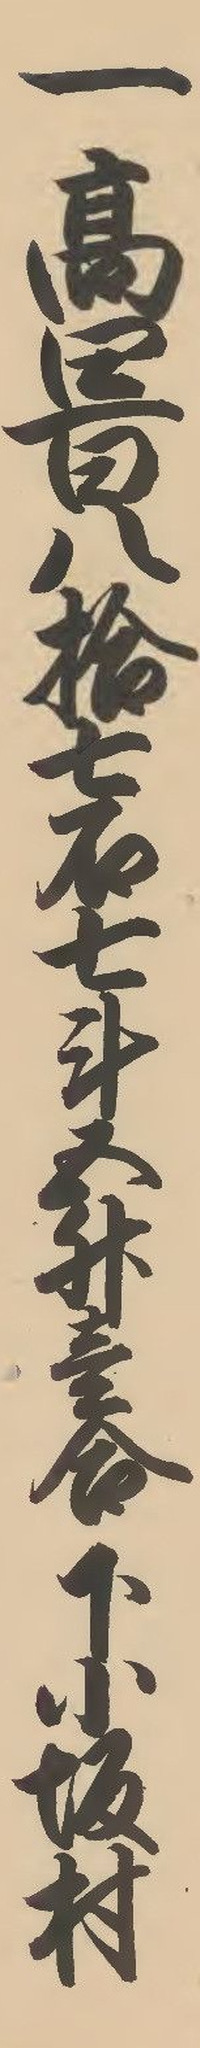一髙四百八拾七石七斗五升壱合下小坂村
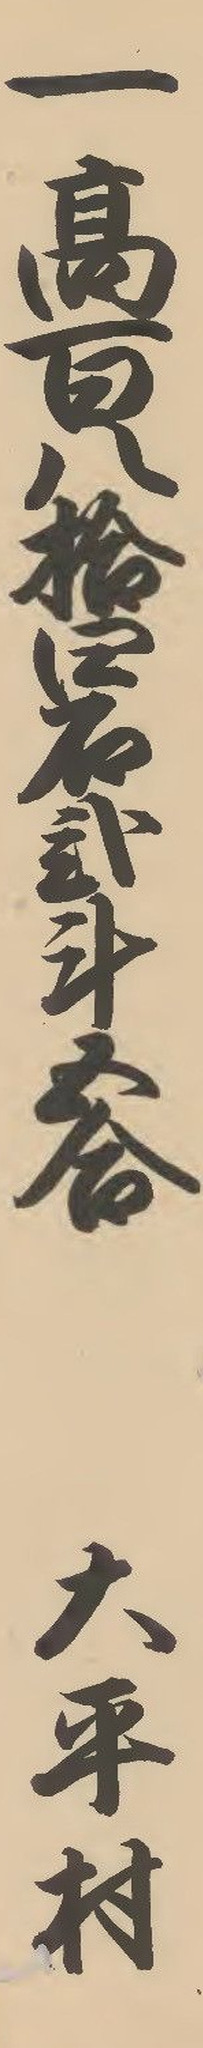一髙百八拾四石弐斗五合大平村
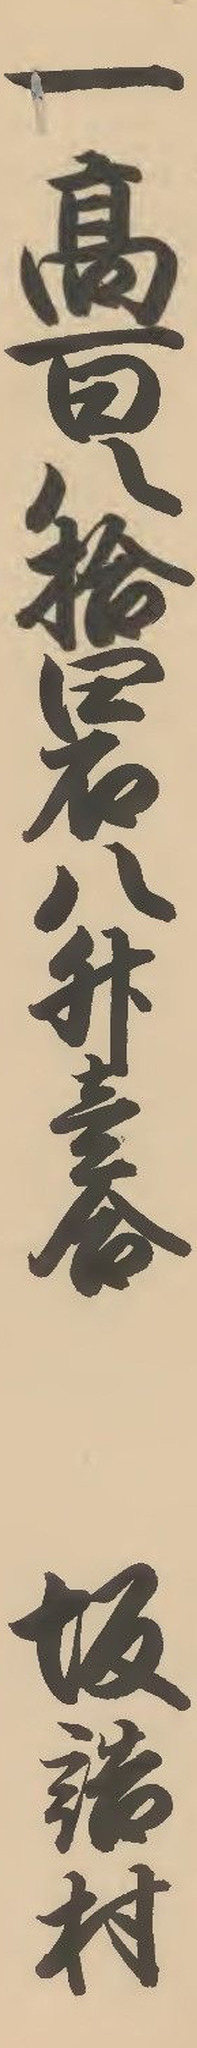一髙百八拾四石八升壱合坂詰村
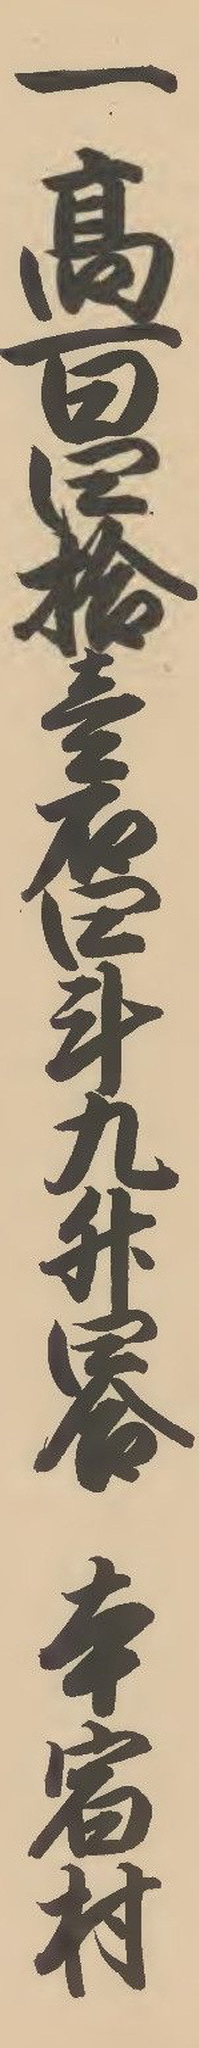一髙百四拾壱石四斗九升四合本宿村
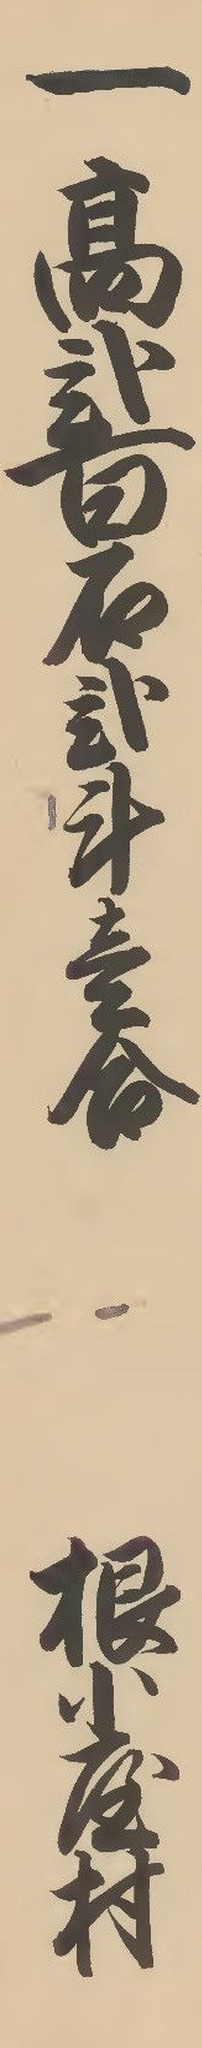一髙弐百石弐斗壱合根小屋村

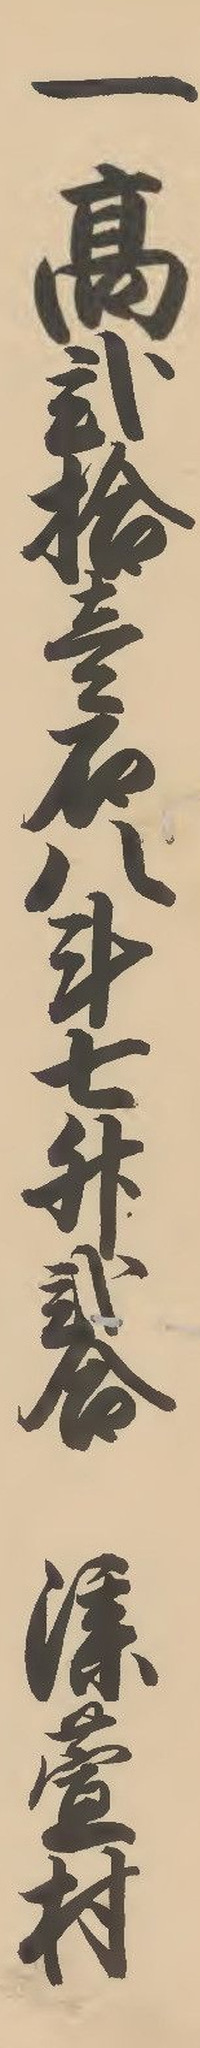一髙弐拾壱石八斗七升弐合萱村
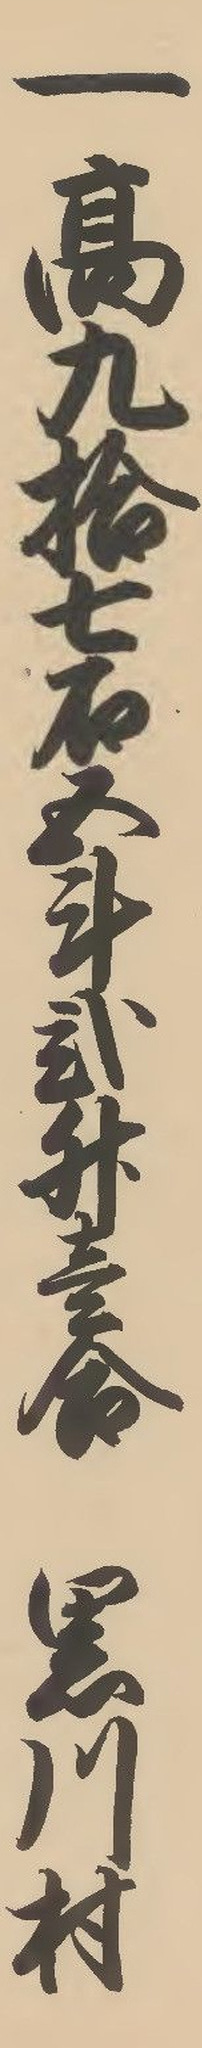一髙九拾七石五斗弐升壱合黑川村
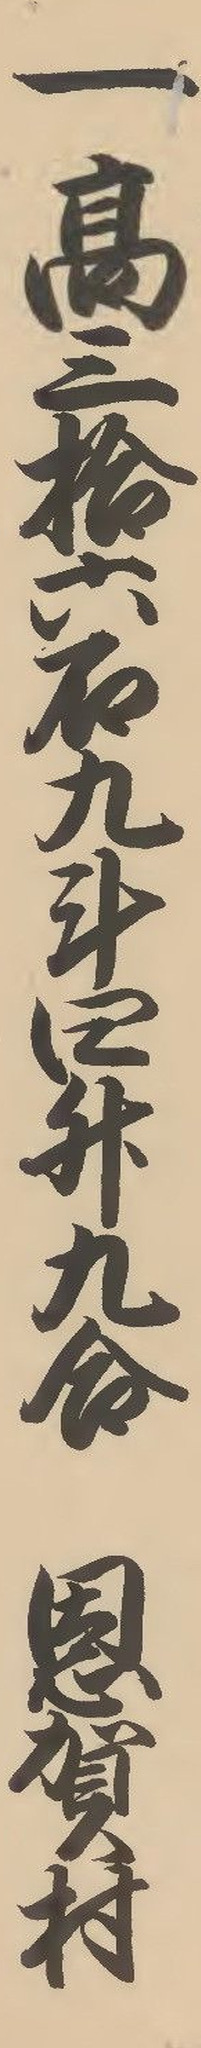一髙三拾六石九斗四升九合恩賀村
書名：上野国郷帳
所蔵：国立公文書館 National Archives of Japan
